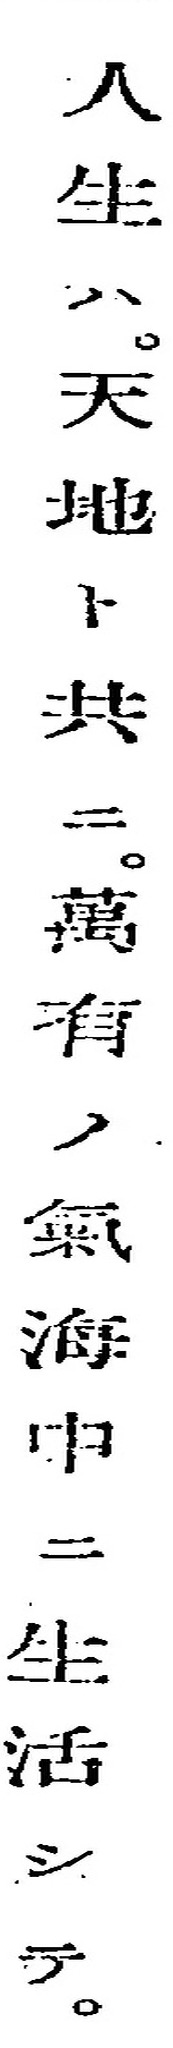人生は。天地と共に。万有の気海中に生活して。
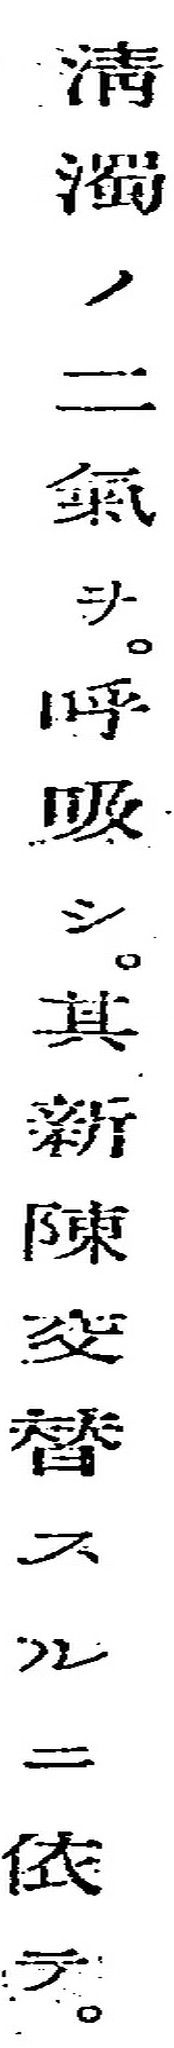清濁の二気を。呼吸し。其新陳交替するに依て。
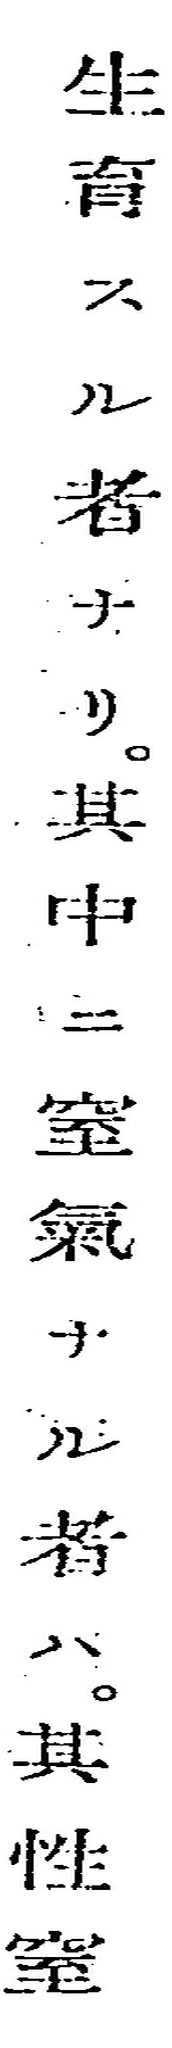生育する者なり。其中に窒気なる者は。其性窒
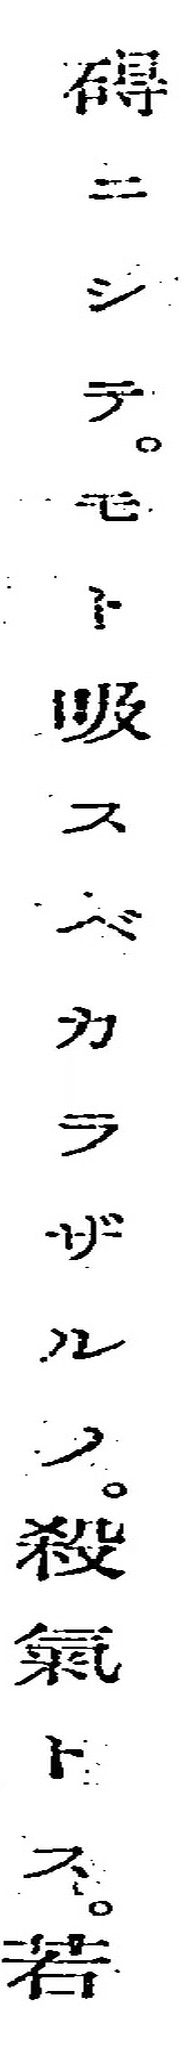碍にして。もと吸すべからざるの。殺気とす。若
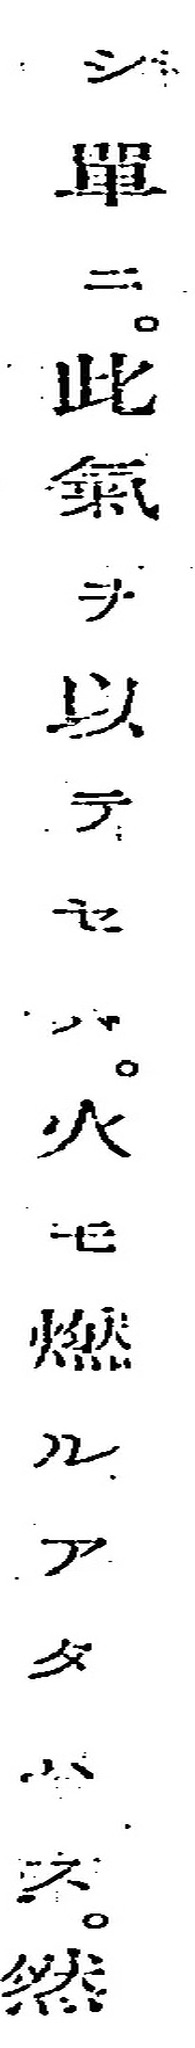し単に。此気を以てせば。火も燃るあたはす。然
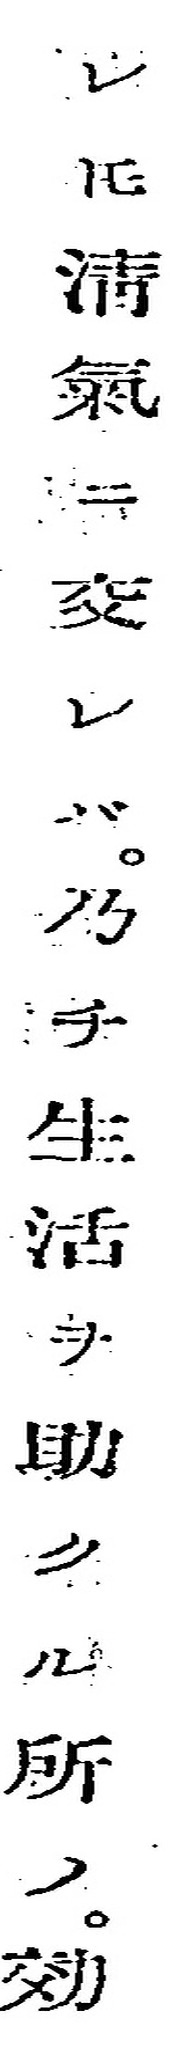れとも清気に交れば。乃ち生活を助くる所の。効
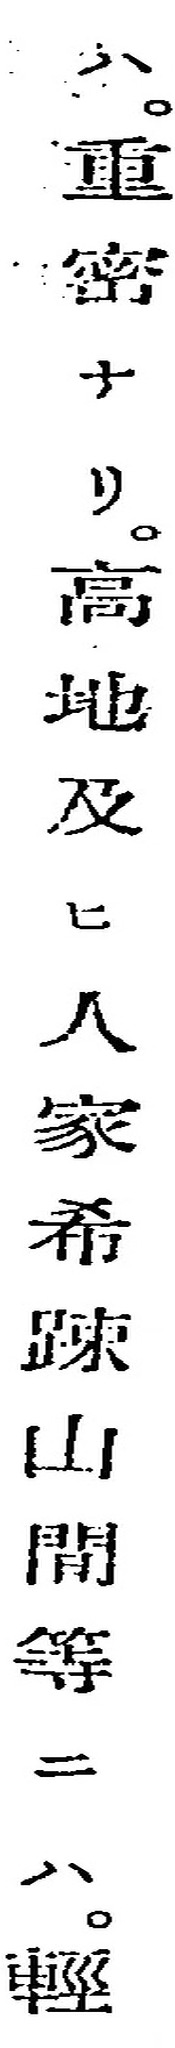は。重密なり高地及ひ人家希踈山間等には。輕
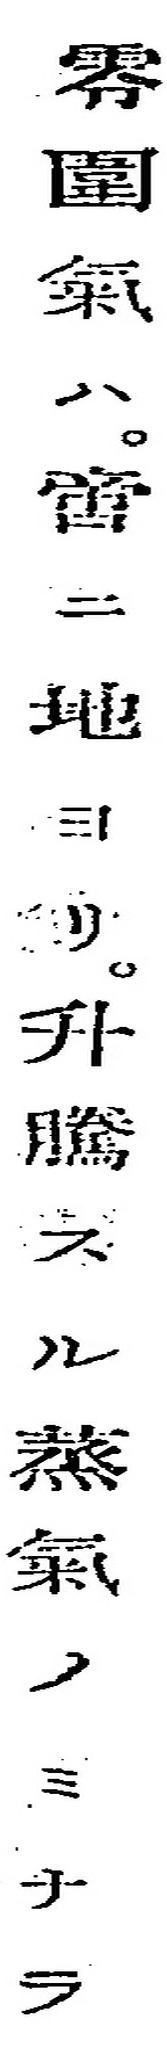雰囲気は。啻に地より。升騰する蒸気のみなら
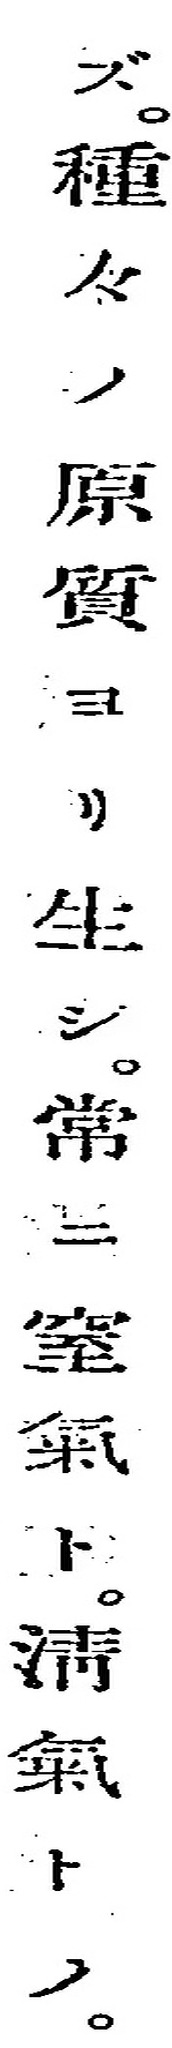ず。種々の原質より生し。常に窒気と。清気との。
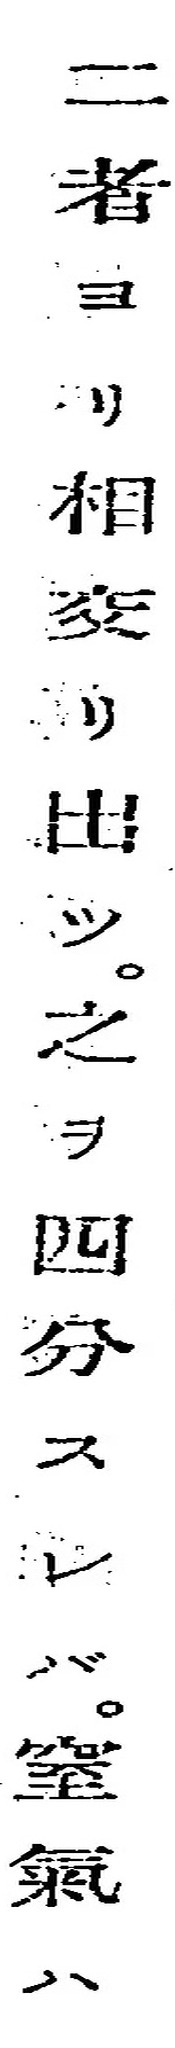二者より相交り出つ。之を四分すれば。窒気は
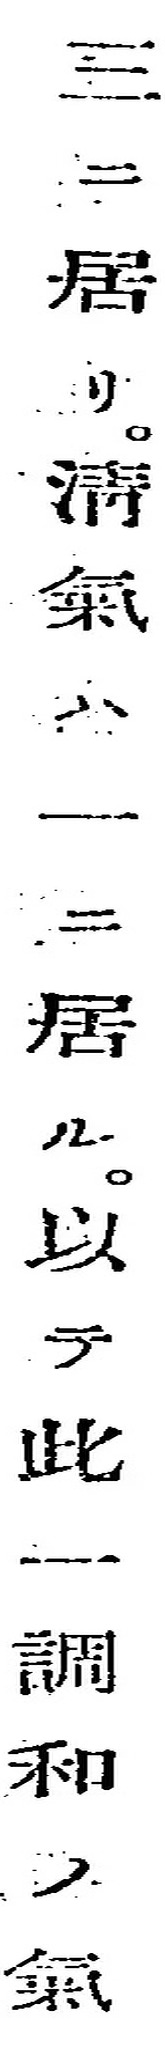三に居り。清気は一に居る。以て此一調和の気
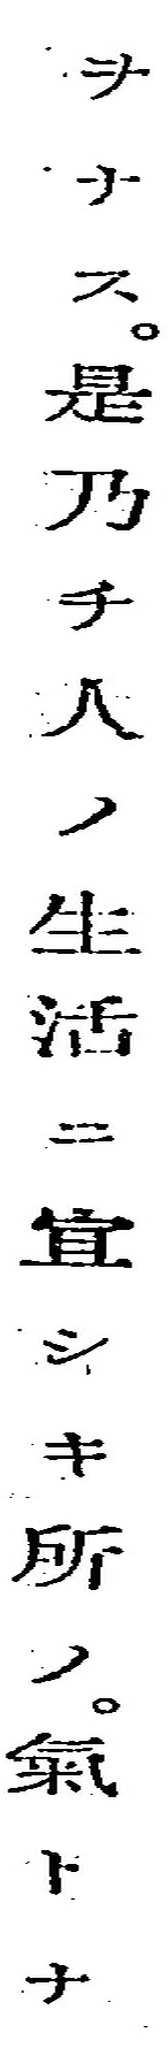をなす。是乃ち人の生活に宣しき所の。気とな
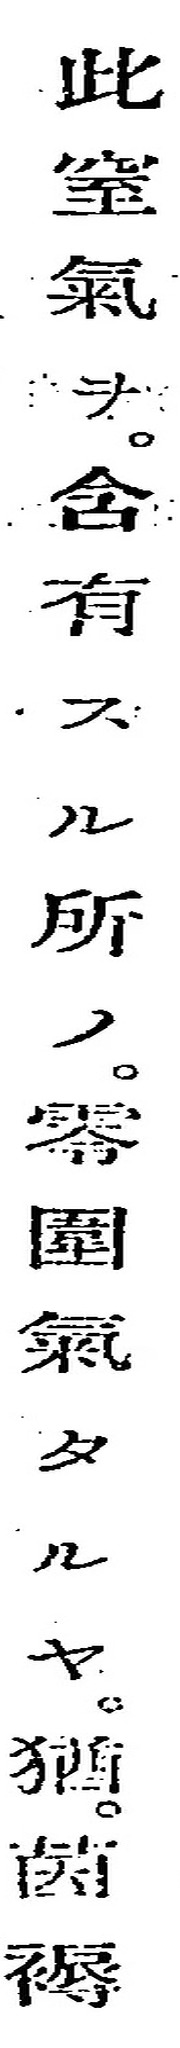此窒気を。含有する所の。雰囲気たるや。猶。茵褥
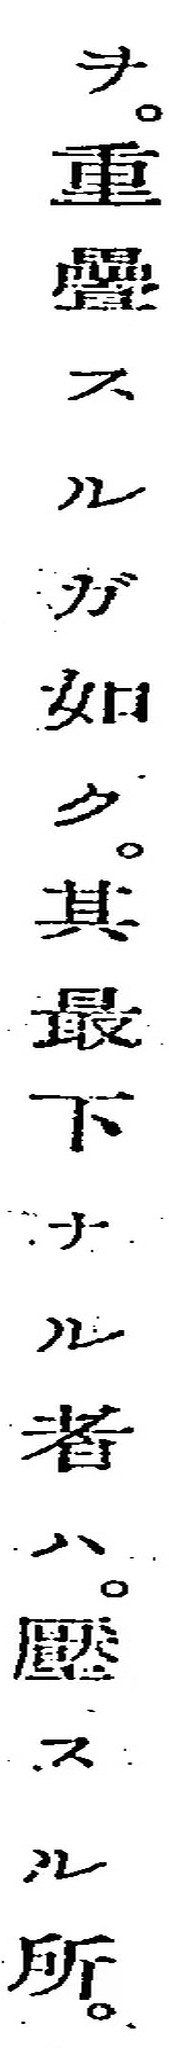を。重畳するが如く。其最下なる者は。壓する所。
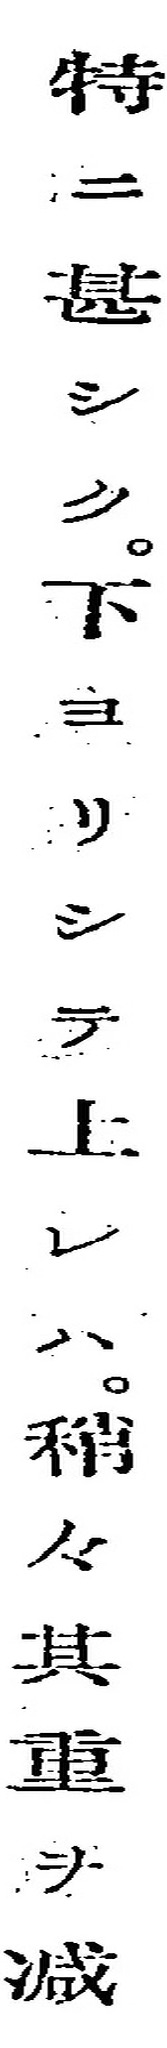特に甚しく。下よりして上れは。稍々其重を減

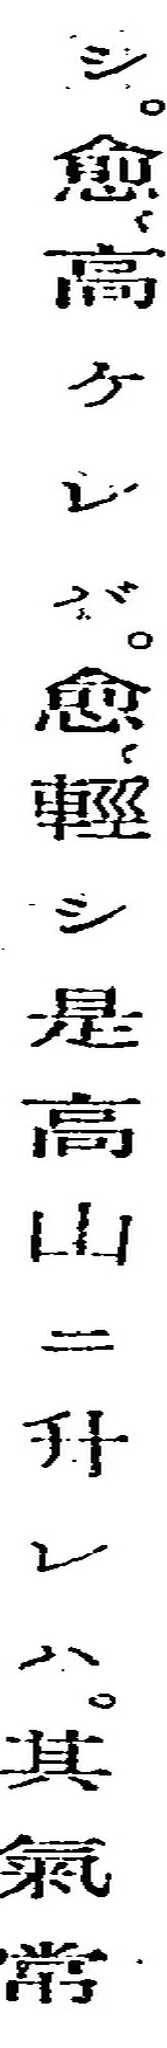し。愈々高ければ。愈々軽し是高山に升れは。其気常
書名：駆疫法 : コレラヲヨケ並ニナホスシカタ
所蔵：国立国会図書館 National Diet Library, JAPAN
